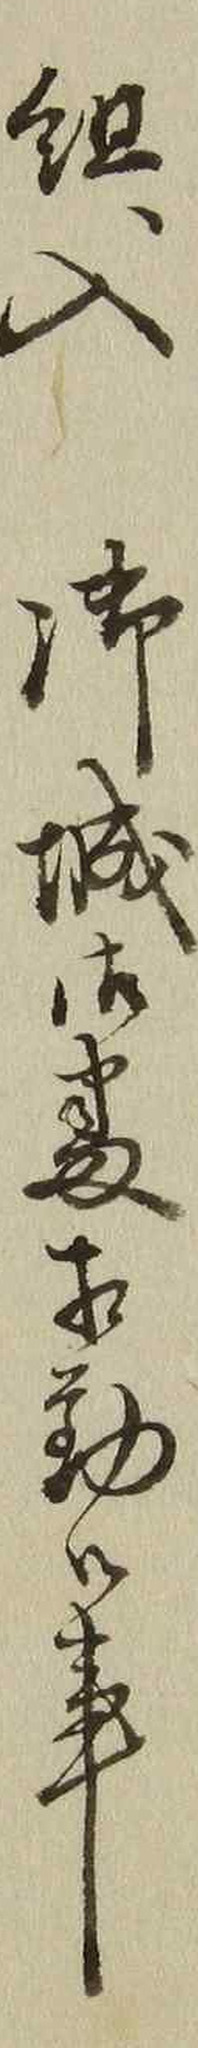組へ入御城御番相勤候事
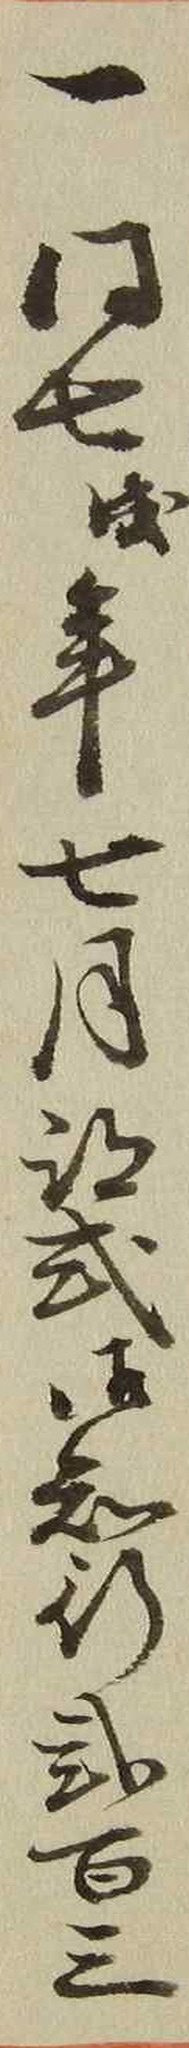一同七戌年七月跡式御知行弐百三
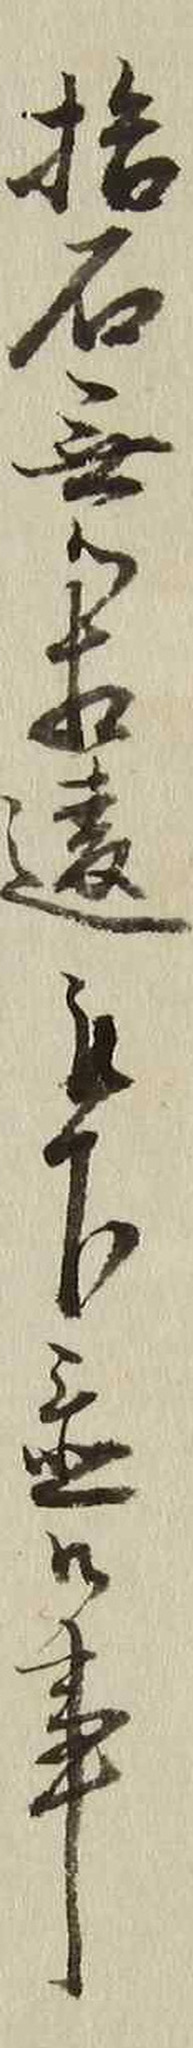拾石無御相違被下置候事
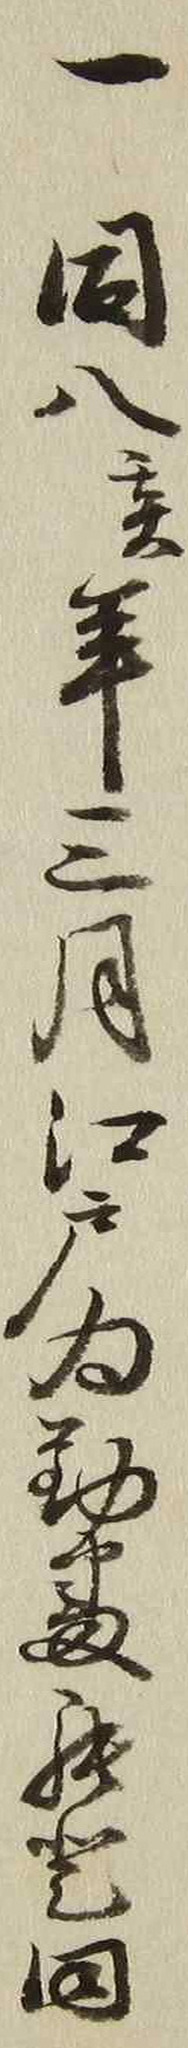一同八亥年三月江戸為勤番罷登同
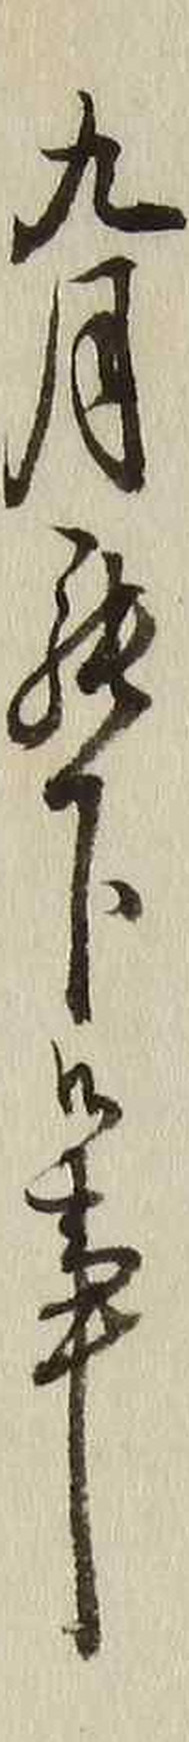九月罷下候事
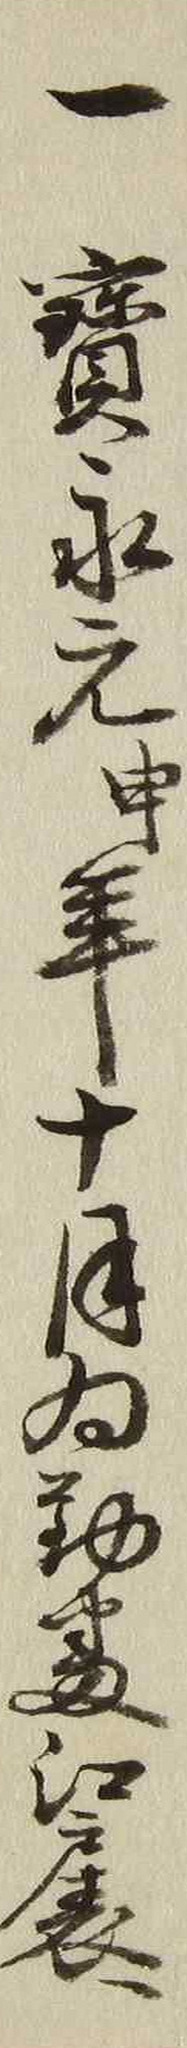一宝永元申年十月為勤番江戸表へ
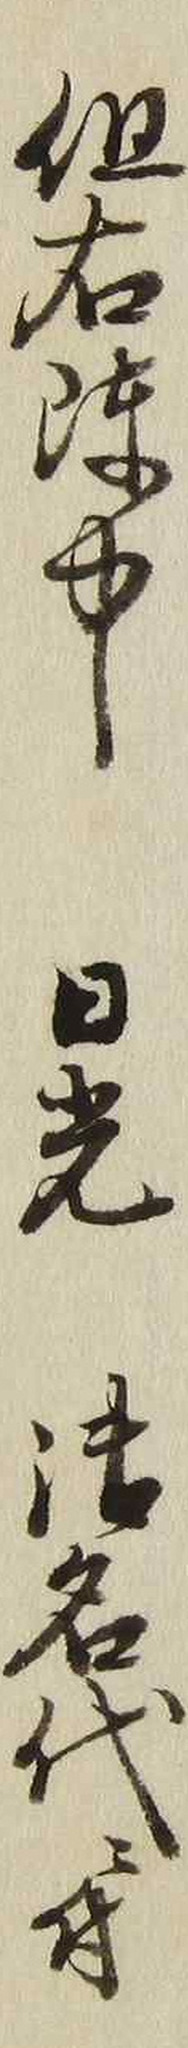但右陣中日光御名代ニ付
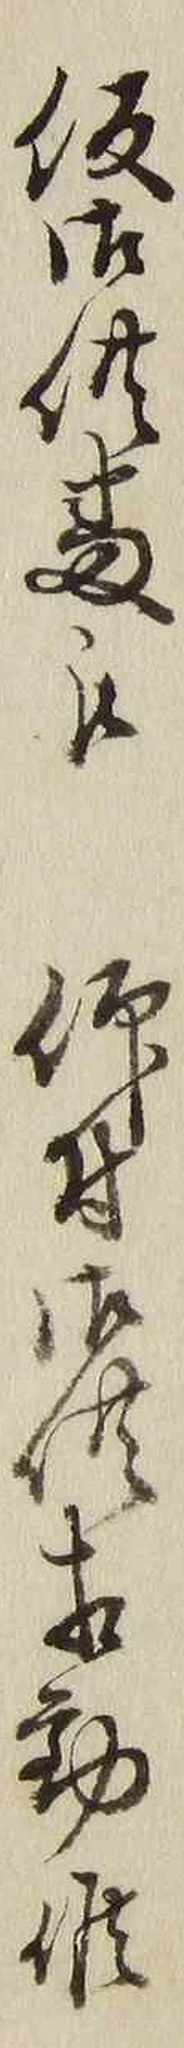仮御供番被仰付御供相勤候
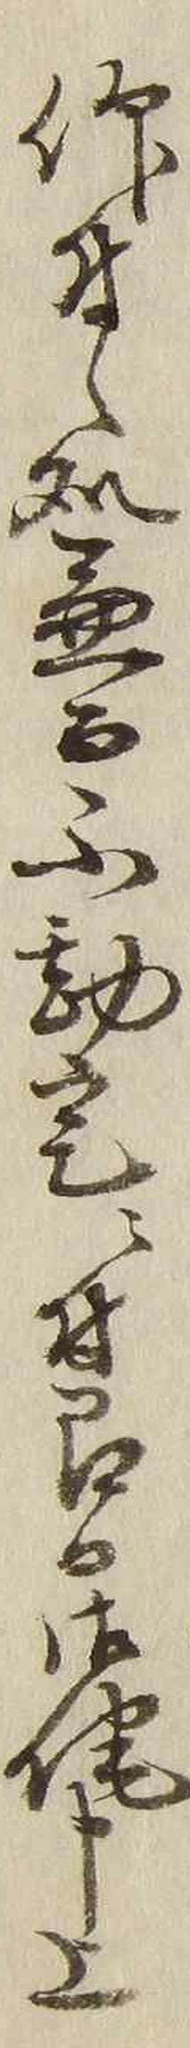仰付候処兼而不勘定ニ付即日御詫申上

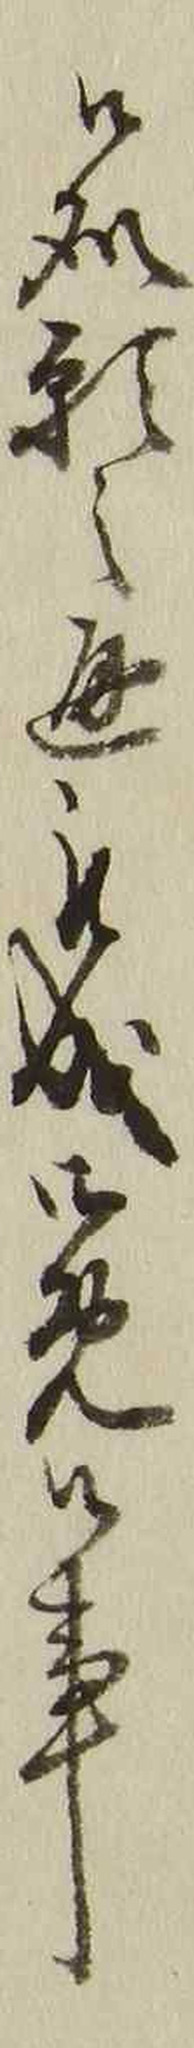候処願之通被成御免候事
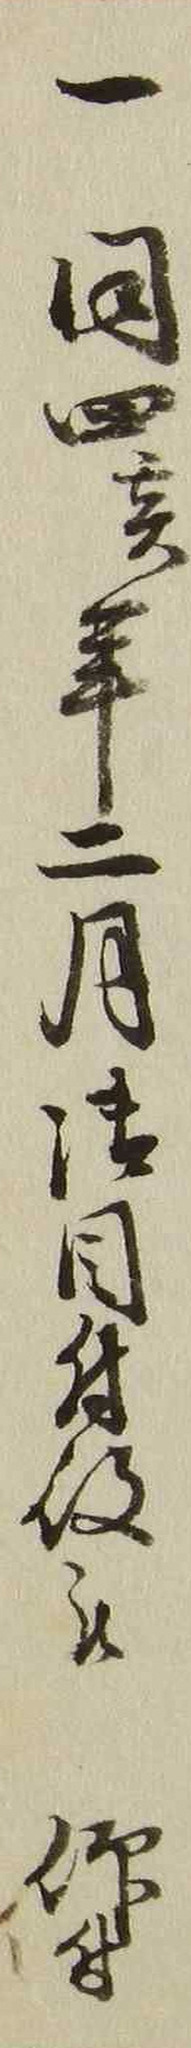一同四亥年二月御目付役被仰付
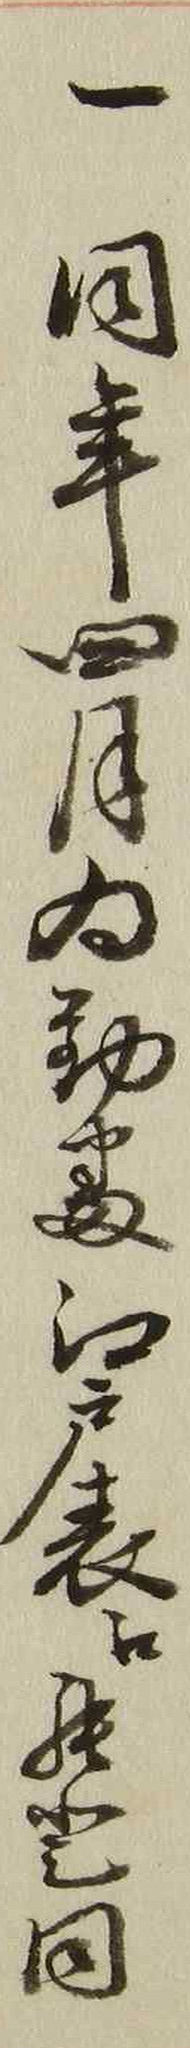一同年四月為勤番江戸表江罷登同
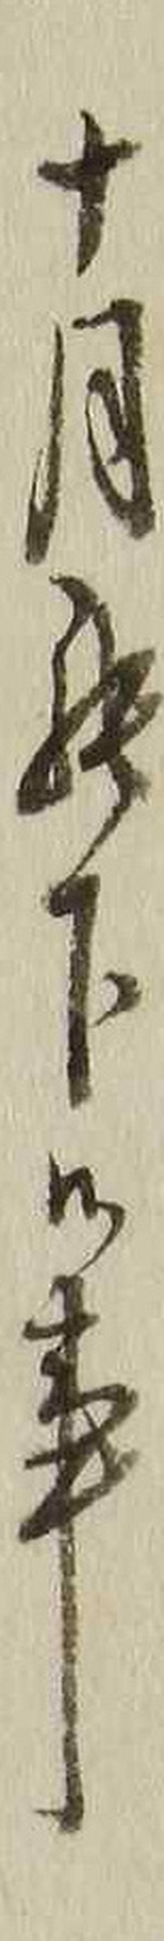十月罷下候事
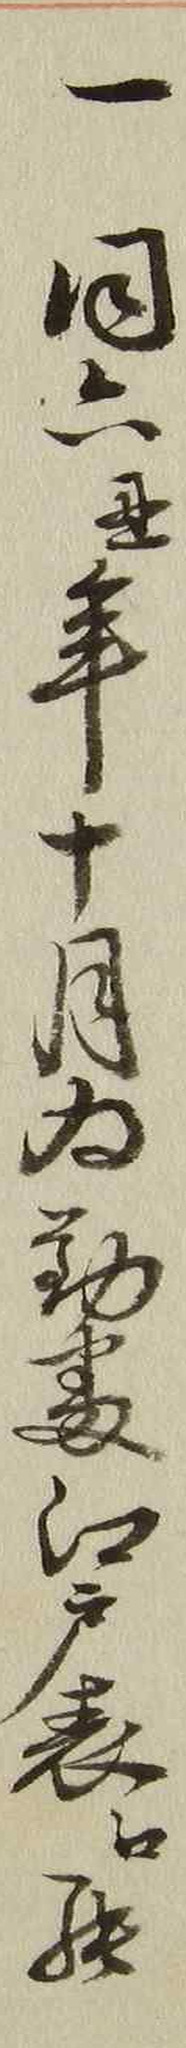一同六丑年十月為勤番江戸表江罷
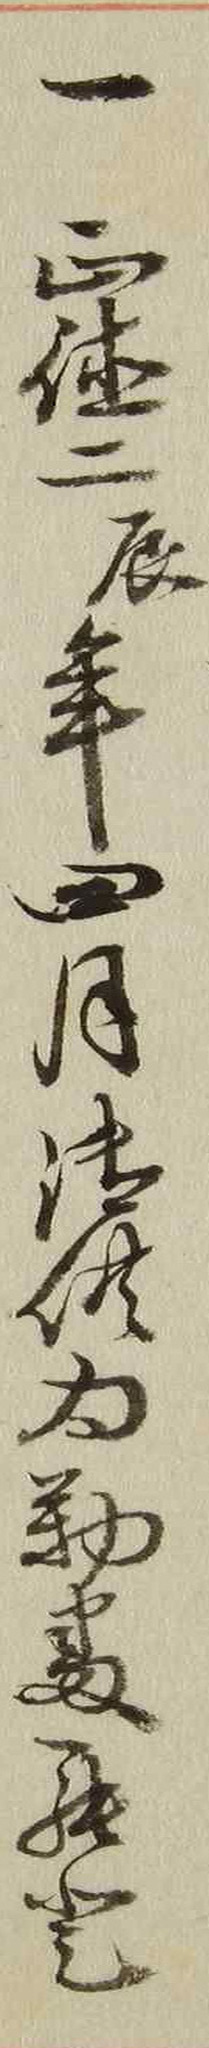一正徳二辰年四月御供為勤番罷登
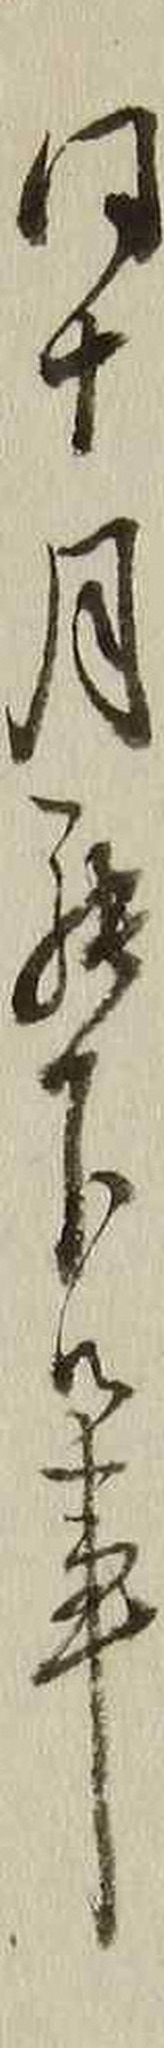同十月罷下候事
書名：諸士系譜　巻之31　い之部31
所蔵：会津若松市立会津図書館
